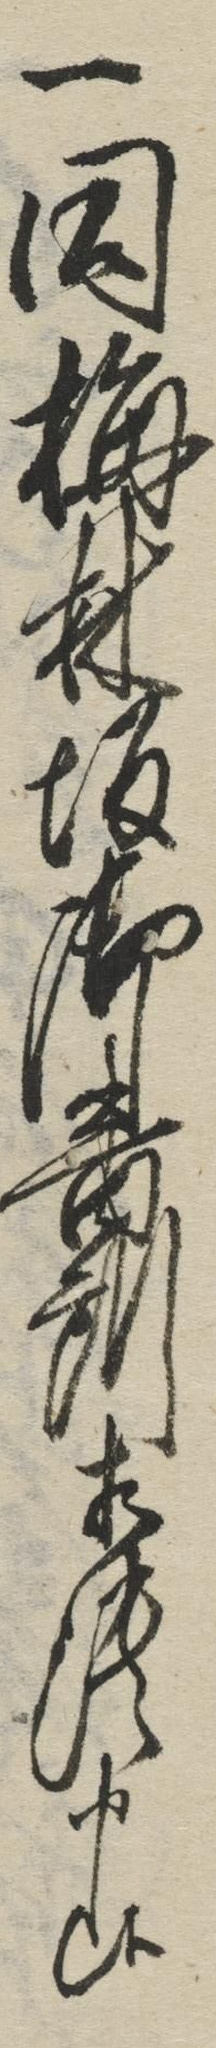一同梅林坂御番所相潰申候
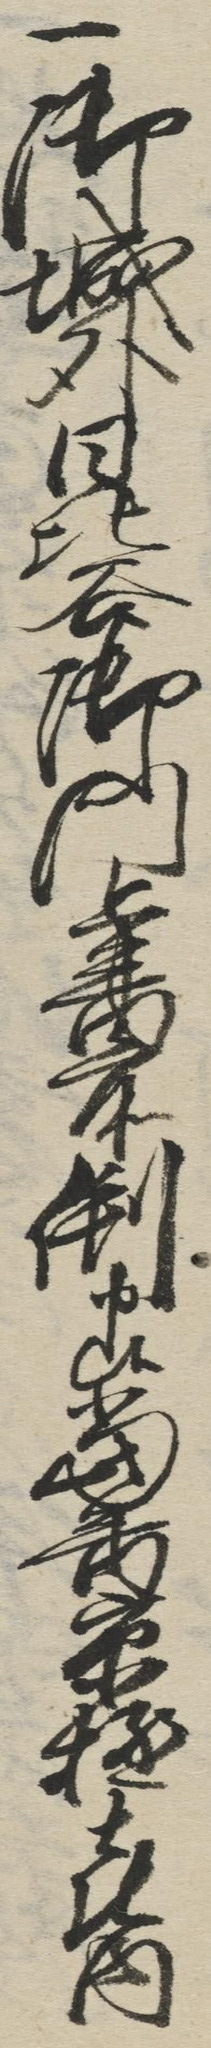一御城外日比谷御門番所倒申候当番京極喜内
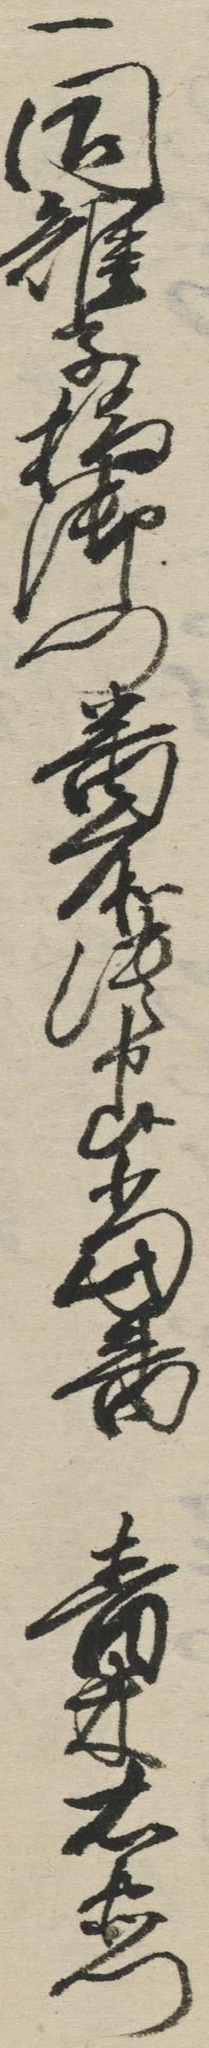一同雉子橋御門番所潰申候当番青木右衛門
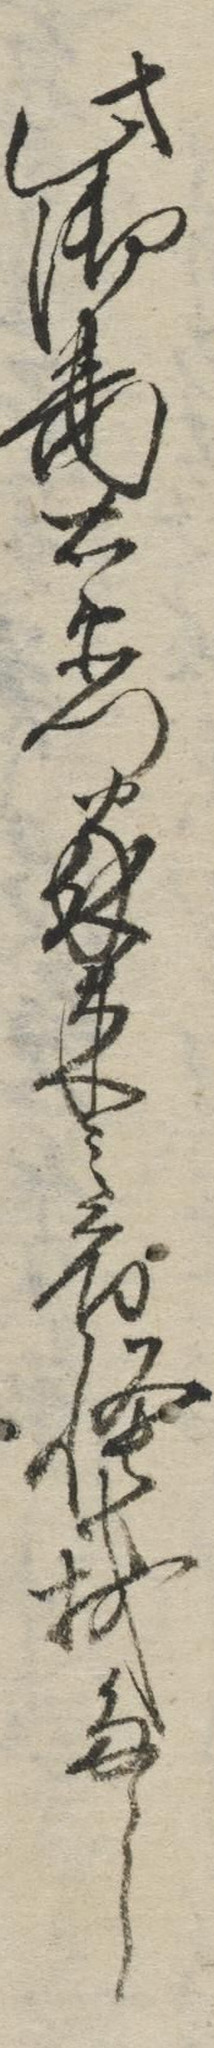此御番右衛門家来之者怪我多し
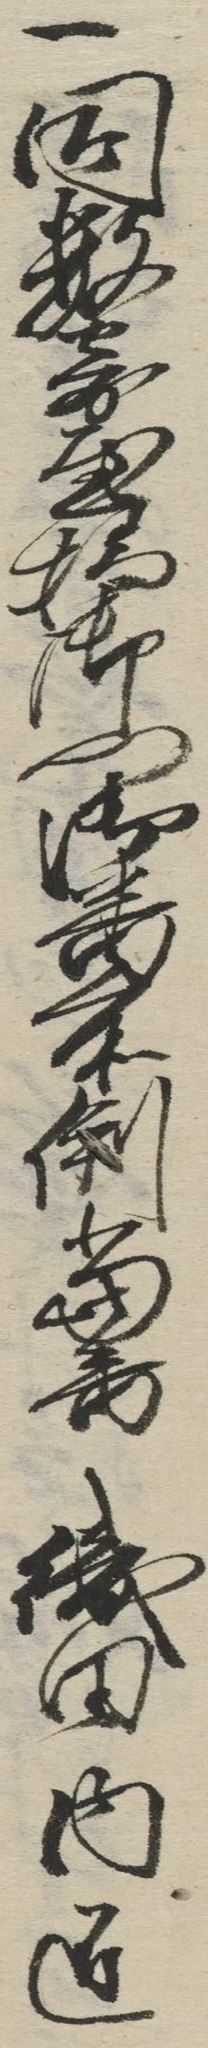一同数寄屋橋御門御番所倒当番織田内匠
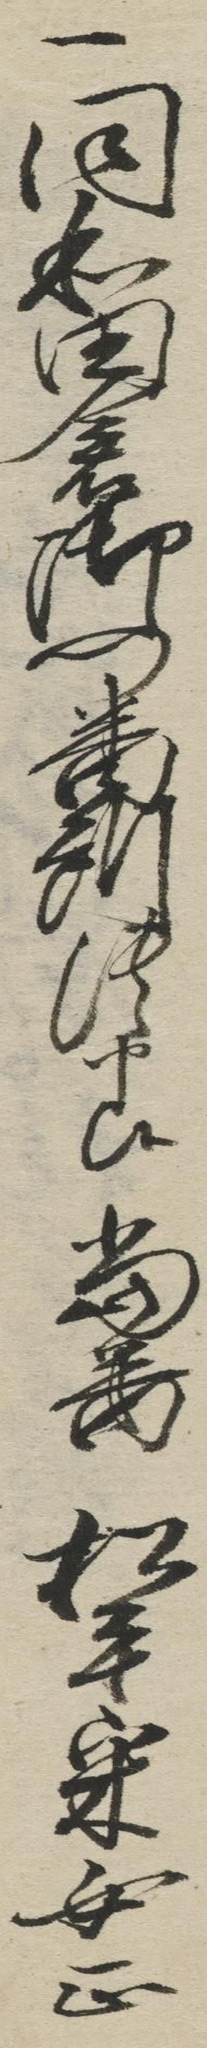一同和田倉御門番所潰申候当番松平采女正
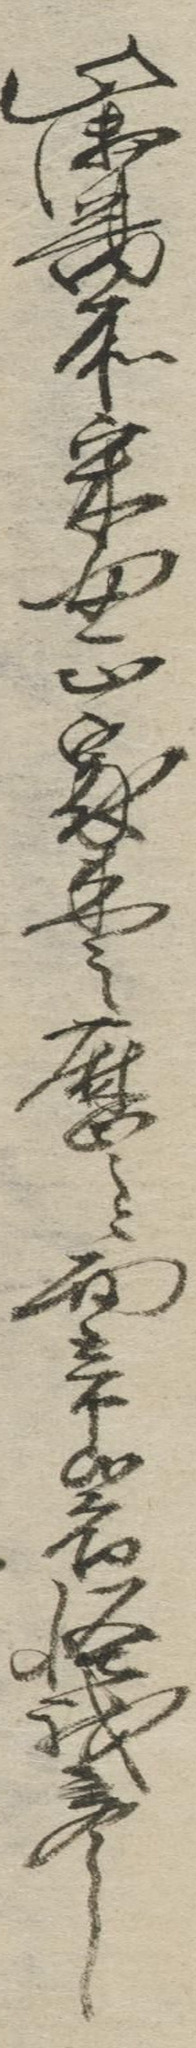此御番所采女正家来之歴々と面立申候者怪我多し
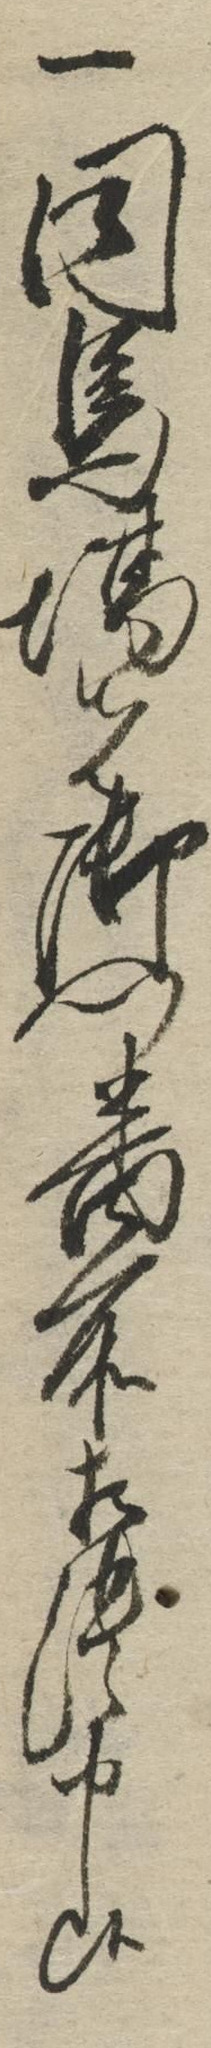一同馬場先御門番所相潰申候

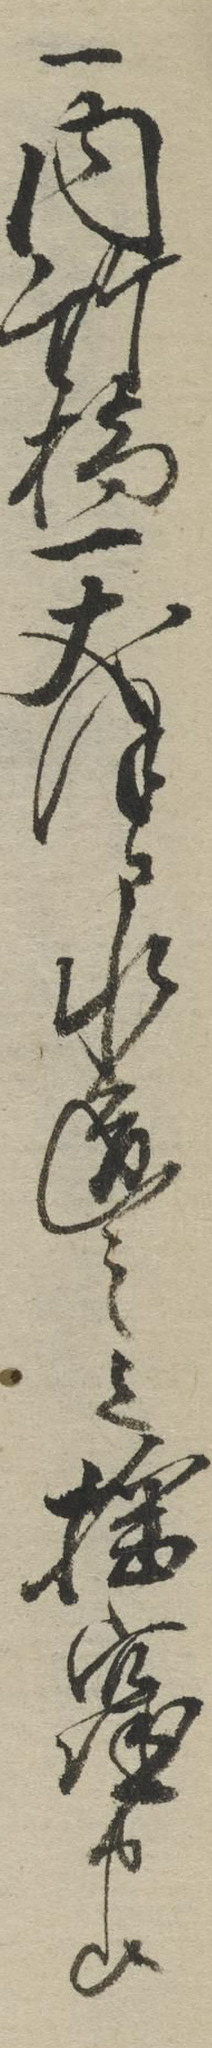一内竹橋一丈津々水道之上揺窪申候
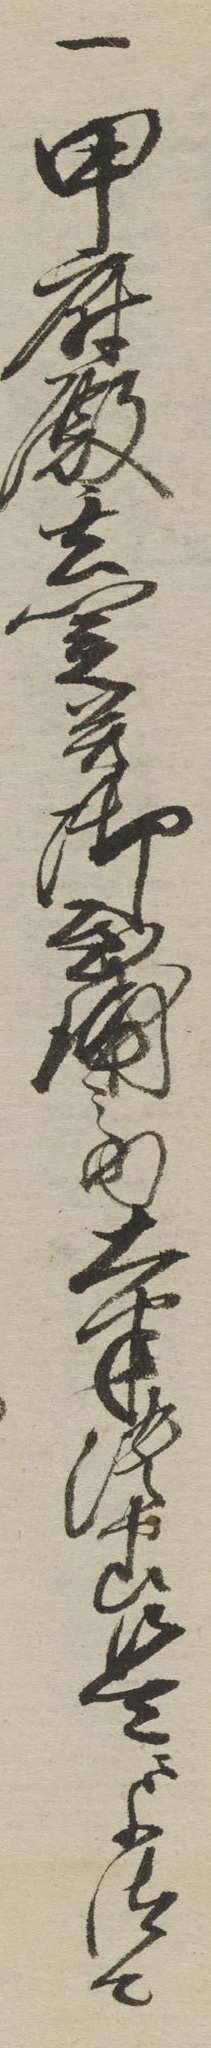一甲府殿玄関并並御屋鋪之内大半潰申候是ニよつて
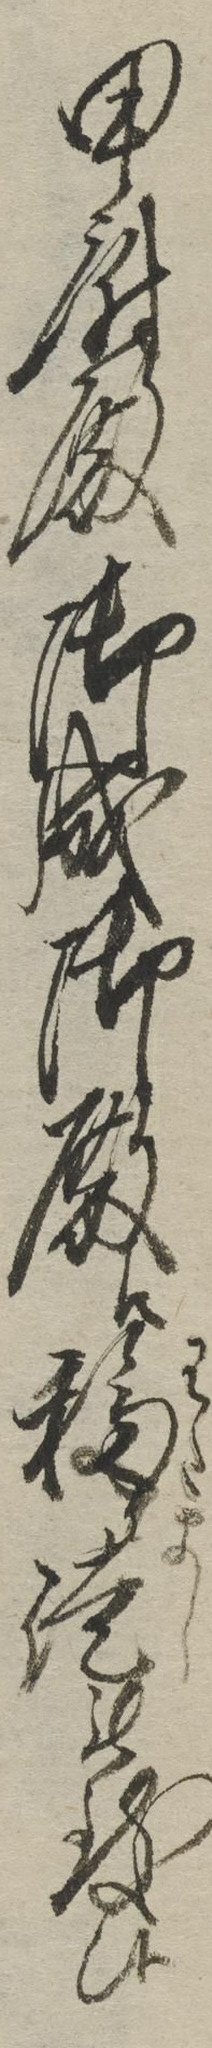甲府殿御成御殿江移徙被致候
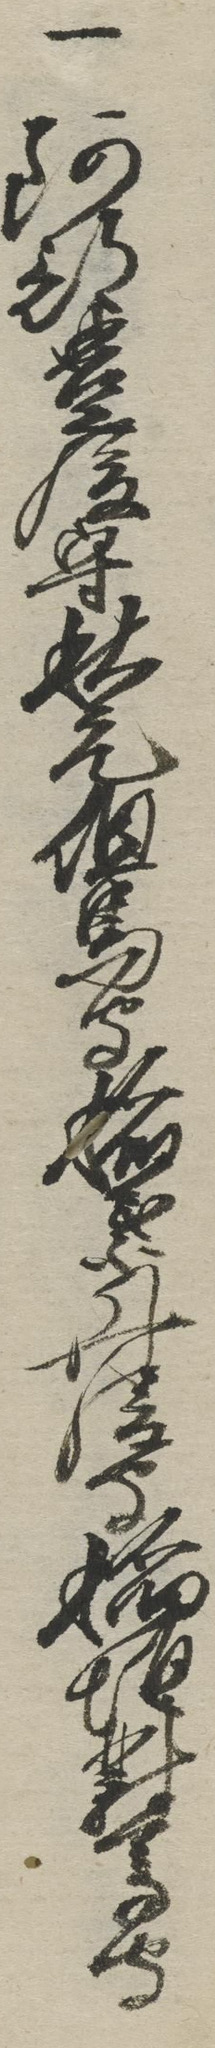一阿部豊後守秋元但馬守稲葉丹後守稲垣対馬守
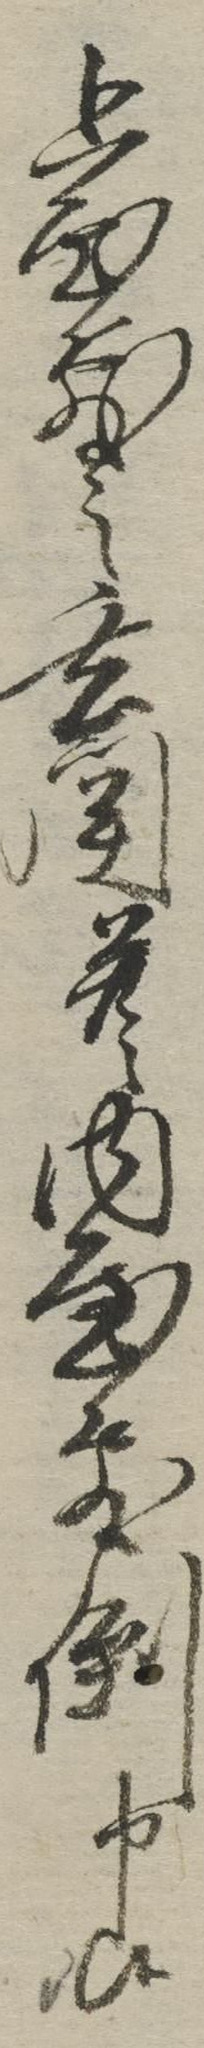上屋敷之玄関并ニ内屋敷倒申候
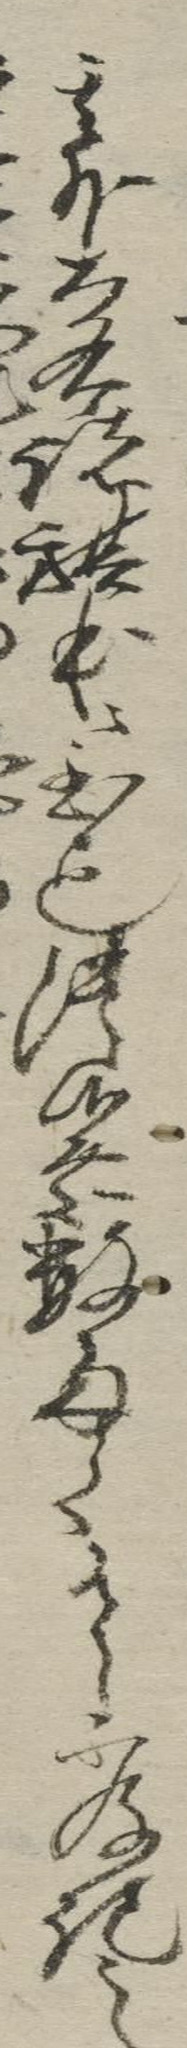其外大名諸旗本二至迄潰候処数多くにて不及記之
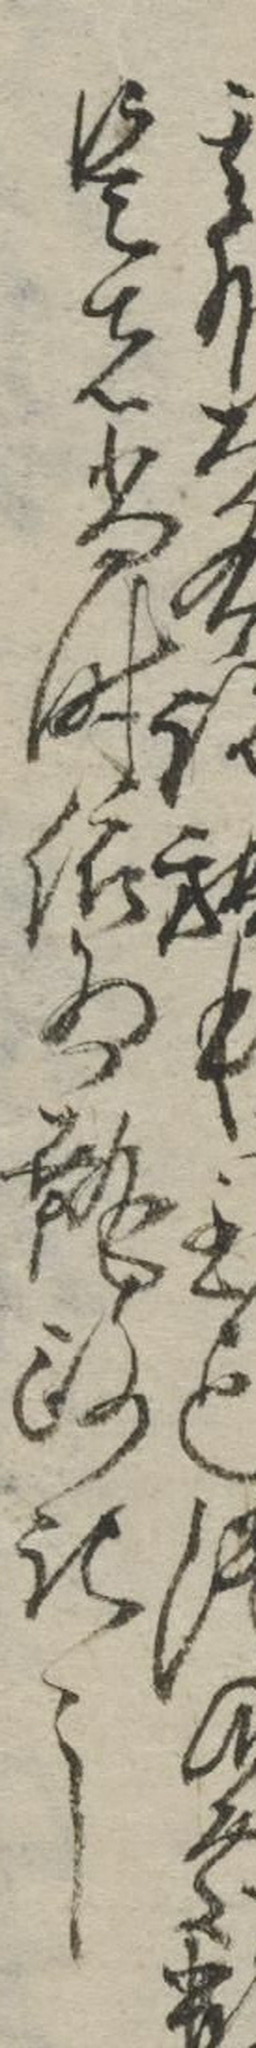是は当時依為執改記之
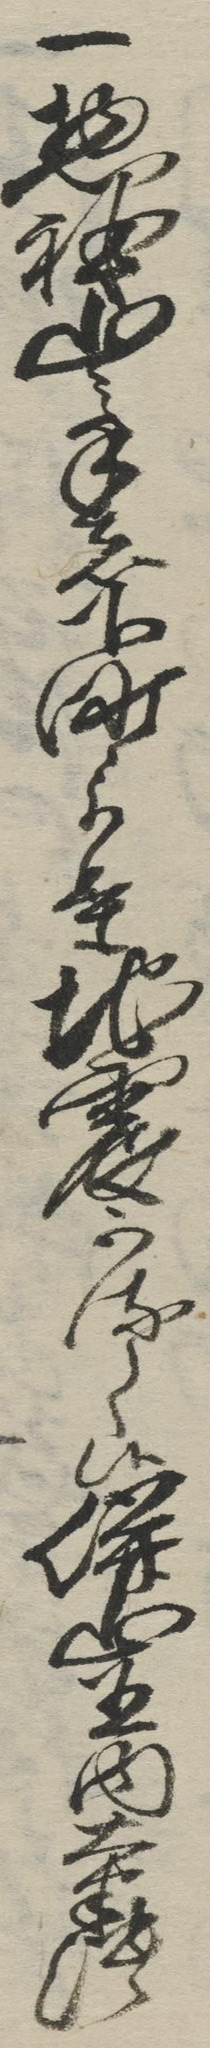一惣躰山之手は下町より地震かるく候併山相内大半潰
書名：元禄地震記
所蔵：東京大学地震研究所図書室 Earthquake Research Institute Library, The University of Tokyo, JAPAN
